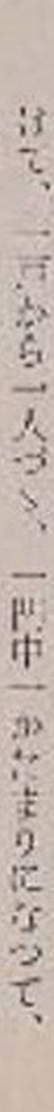けて、一戸から一人づゝ、一門中一かたまりになつて、
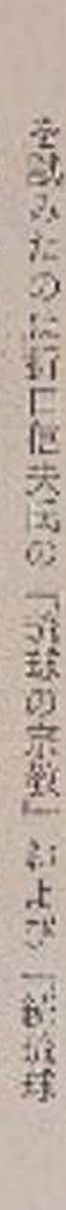を試みたのは折口信夫氏の『琉球の宗教』および『続琉球
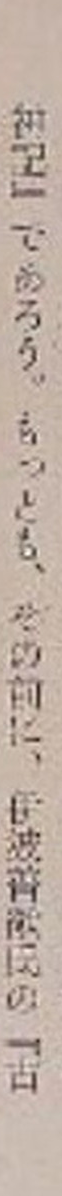神記』であろう。もっとも、その前に、伊波普猷氏の『古
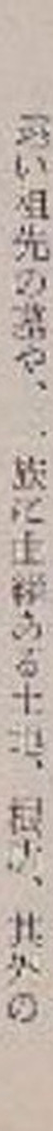遠い祖先の墓や、一族に由縁ある土地、根所、其外の
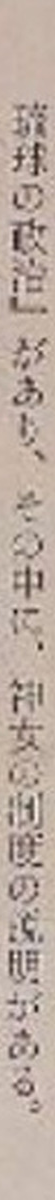琉球の政有信仰治』があり、その中に、神女の制度の説明がある。
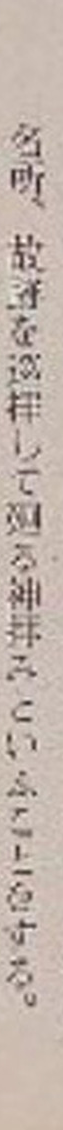名所、故跡を巡拝して廻る神拝みといふことをする。
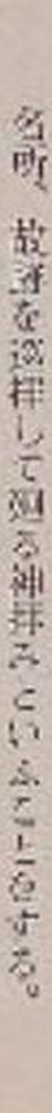名所、故跡を巡拝して廻る神拝みといふことをする。
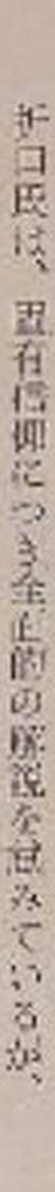折口氏は、固につき全面的の解説を試みているが、
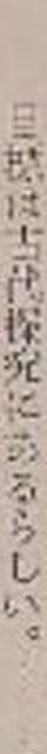目標は古代にあるらしい。
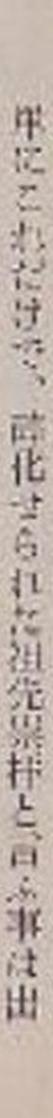単にこれだけで、醇化せられた祖先崇拝と言ふ事は出
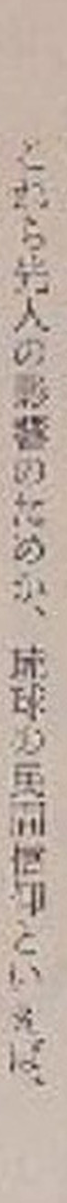これら先人の影響のためか、琉球の民間信仰といえば、
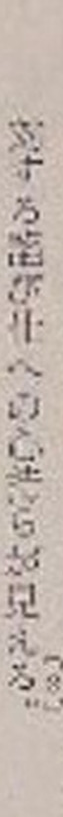対する諂び仕への心持ちが見える。
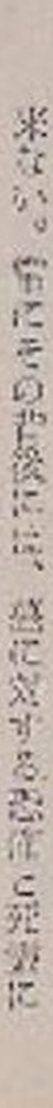来ない。常にその背後には、墓に対する恐怖と死霊に
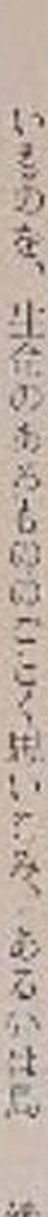いものを、生命のあるもののごとく思いこみ、あるいは島
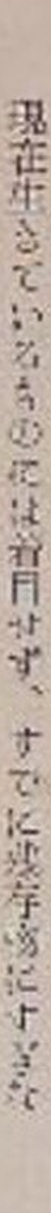現在生きているものには着目せず、すでに残存物にすぎな
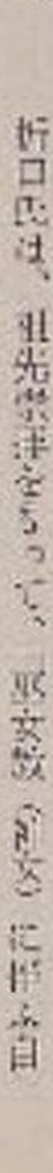折口氏は、祖先崇拝をもって、巫女教(神女)に伴ふ自
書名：沖縄固有信仰のおとろえ
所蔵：University of the Ryukyus Library
